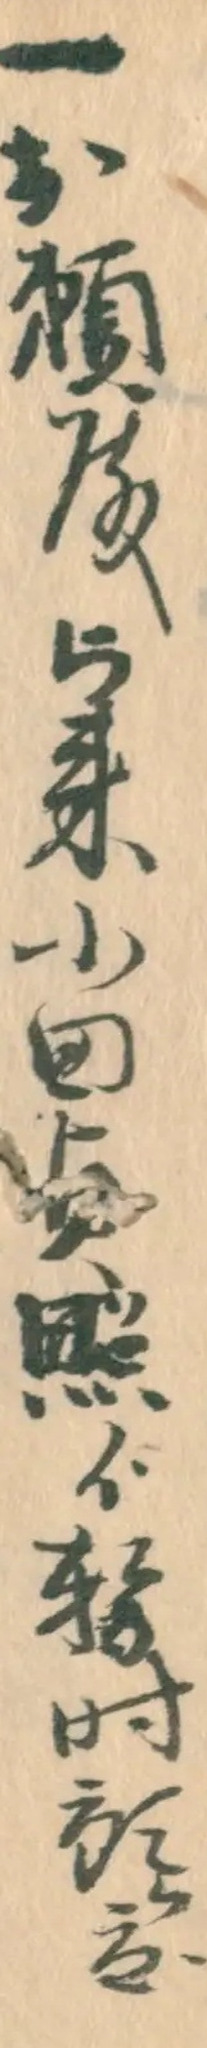一お頼殿被来小田貞照ゟ暫時預ケ度
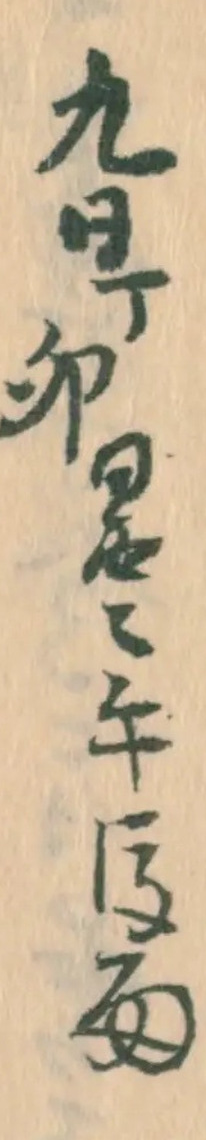九日丁卯曇午後雨
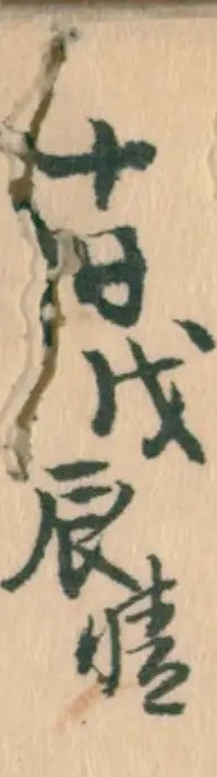十日戊辰晴
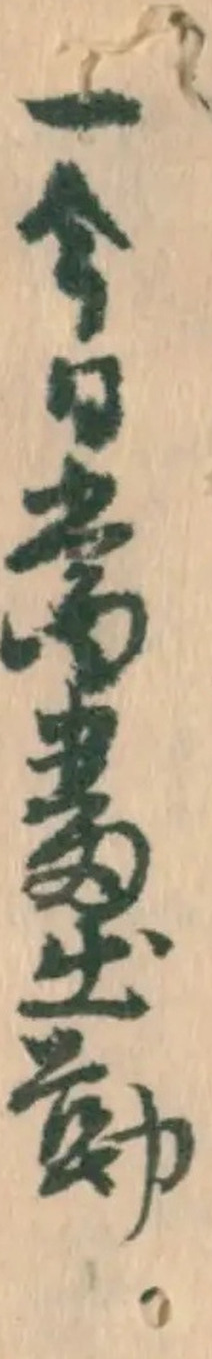一今日当番出勤
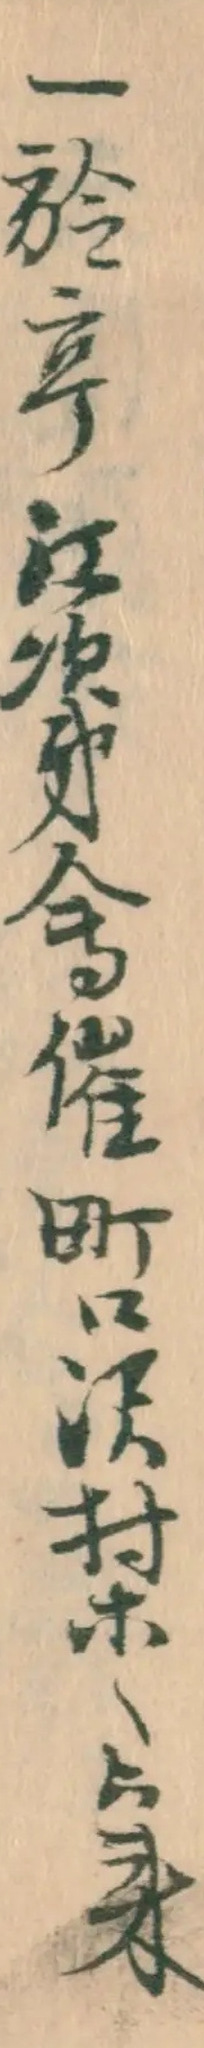一於亭江次第会催町口沢村等へ被来
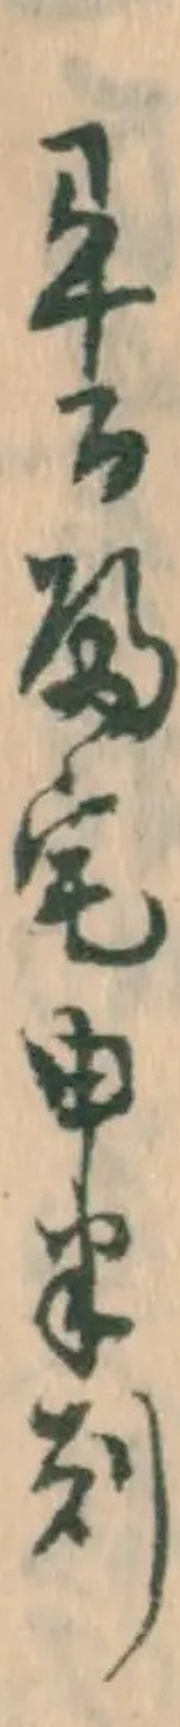畢而帰宅申半刻
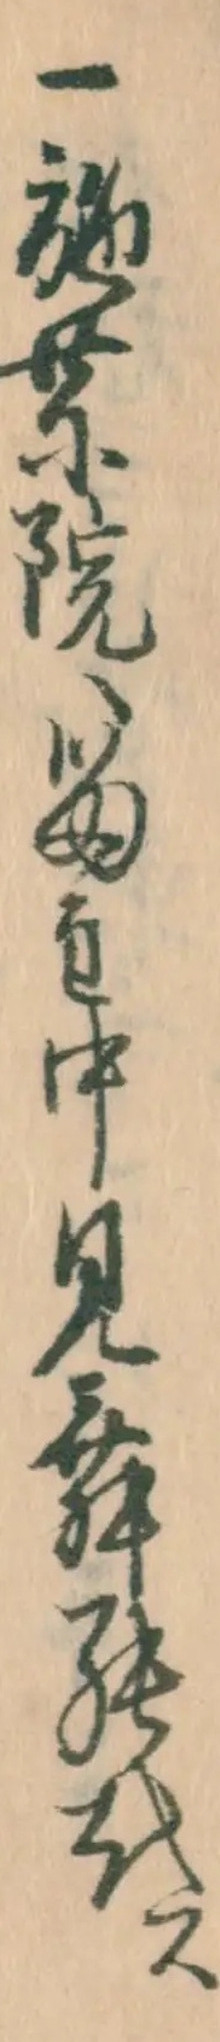一施薬院へ留主中見舞罷越ス
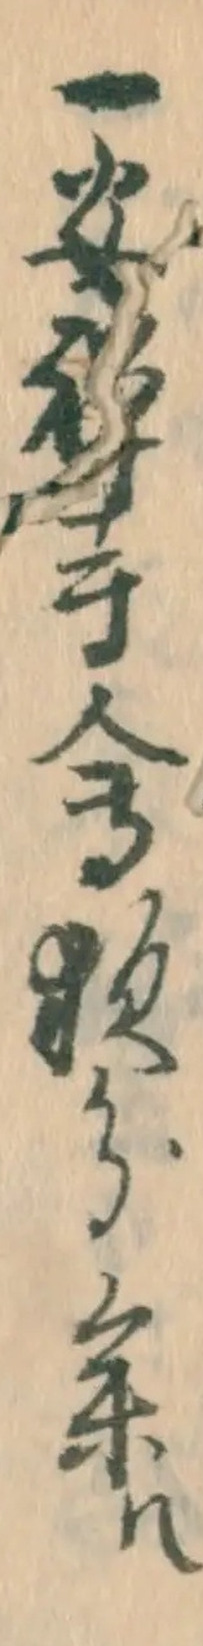一安禅寺会夜分参ル
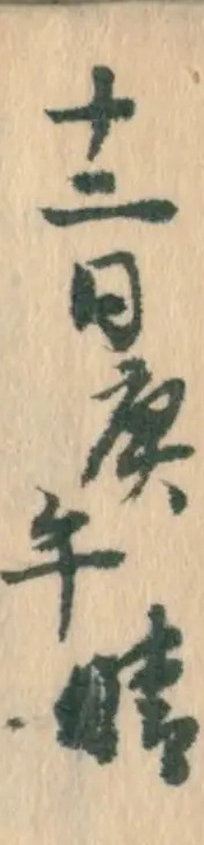十二日庚午晴
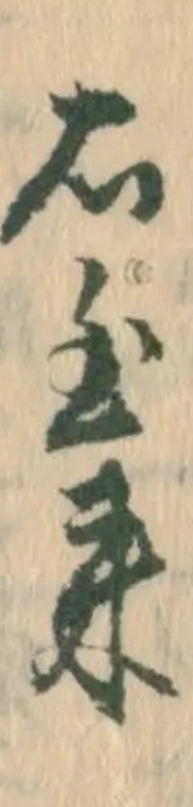右到来

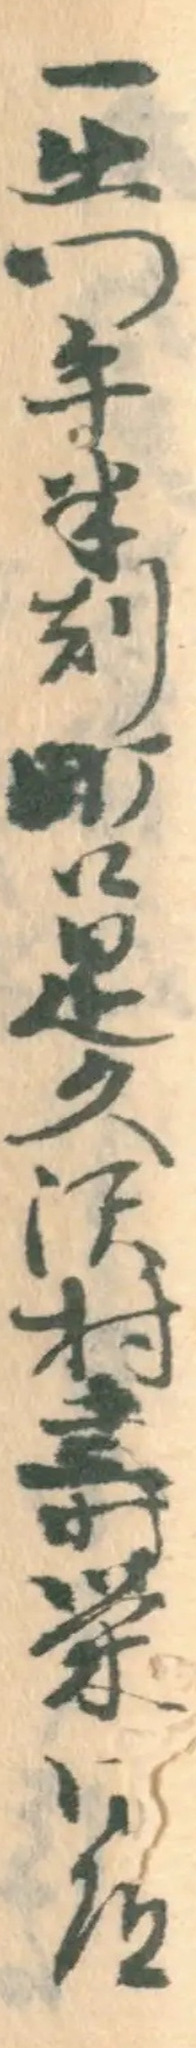一出門午半刻町口是久沢村寿栄同道
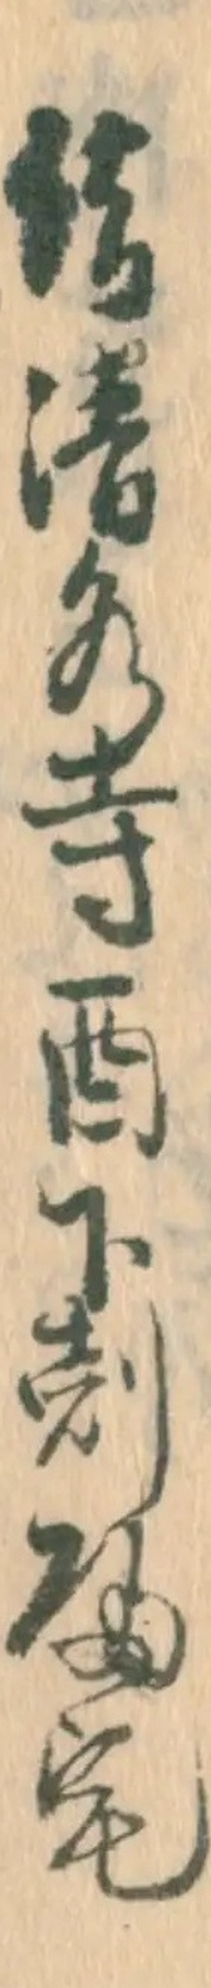詣清水寺酉下刻帰宅
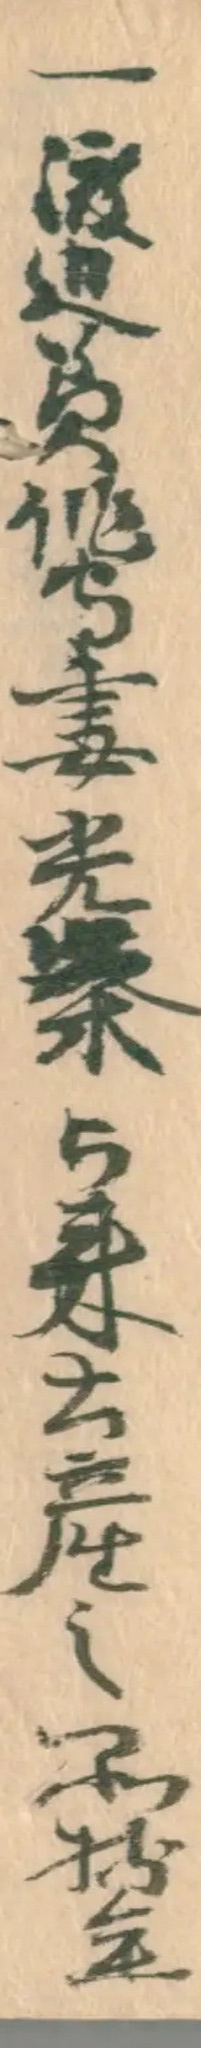一渡辺美作守妻光柴被来土産之品持参
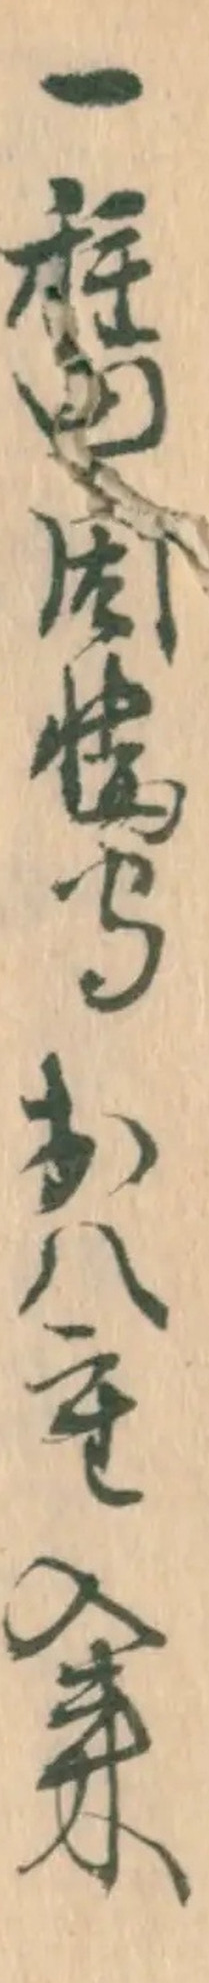一種田因幡守お八重入来
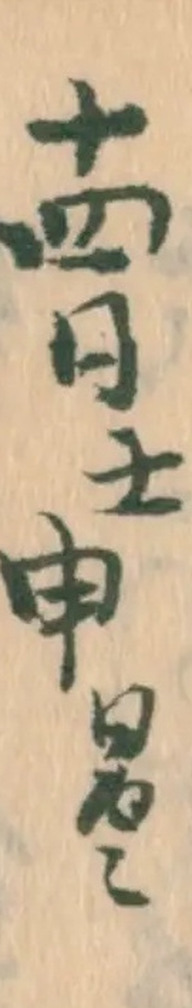十四日壬申曇
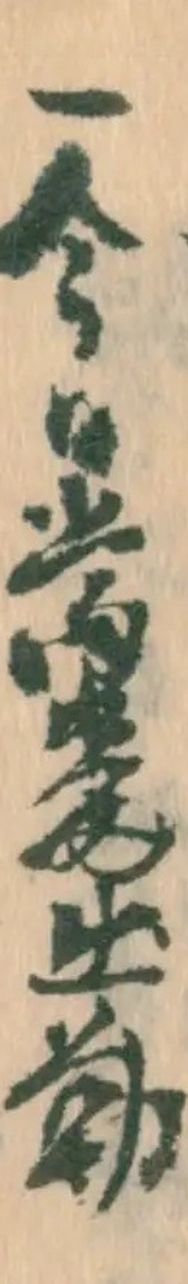一今日当番出勤
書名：禁裏御所御用日記. [131]
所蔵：国立国会図書館 National Diet Library, JAPAN
